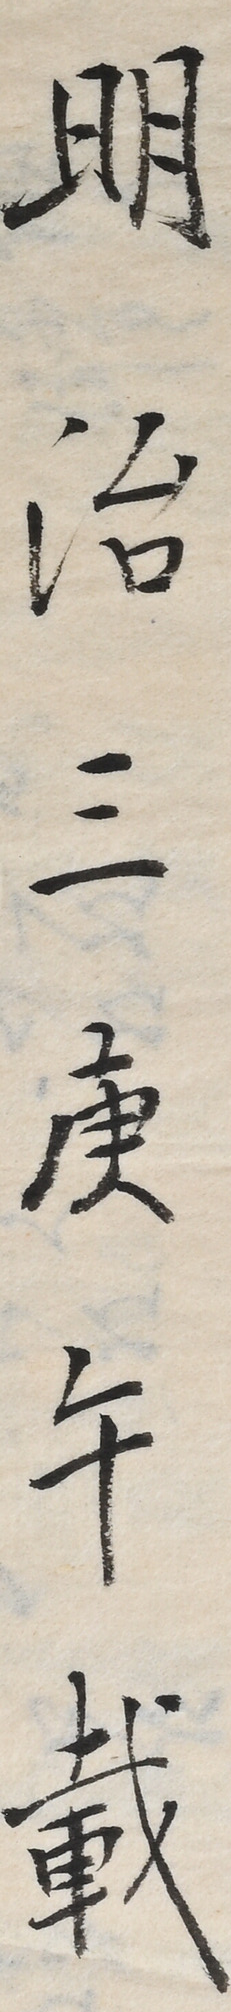明治三庚午載
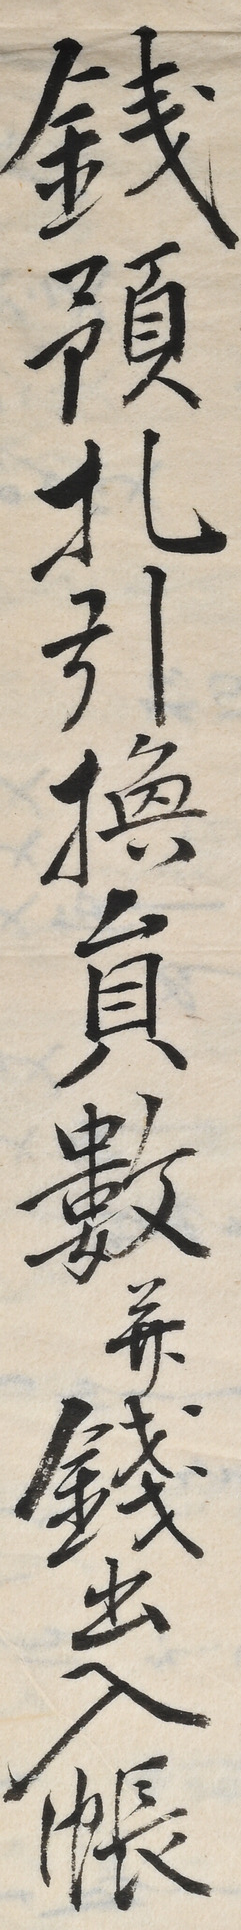銭預札引換員数并銭出入帳
